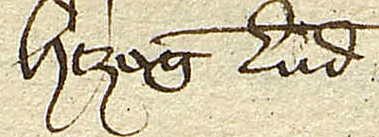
h*cʒog Lud*
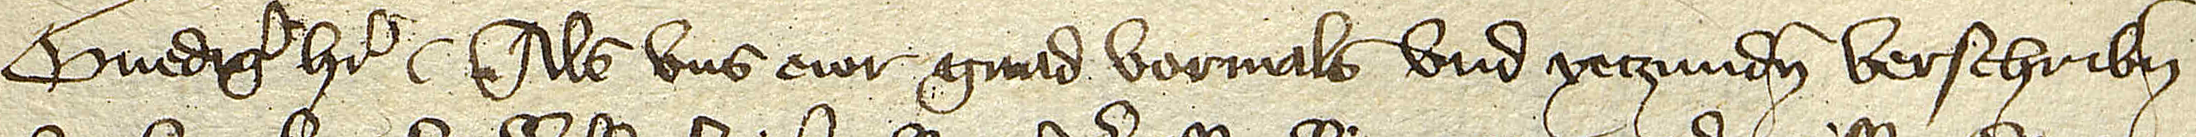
Gnedig* hr* / Als vns ewr gnad vormals vnd yecʒundn* verſchribn*
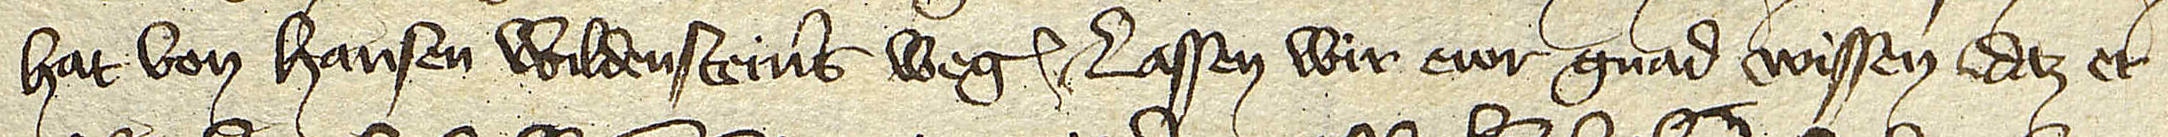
hat von hanſen Wildenſtein*s weg* / Laſſen wir ewr gnad wiſſen / daʒ er
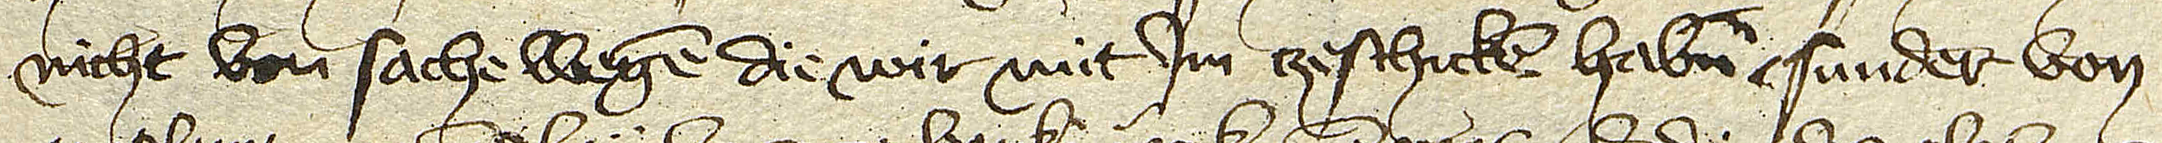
nicht von ſache wege* die wir mit Im cʒeſchicke* habn* / ſunder von
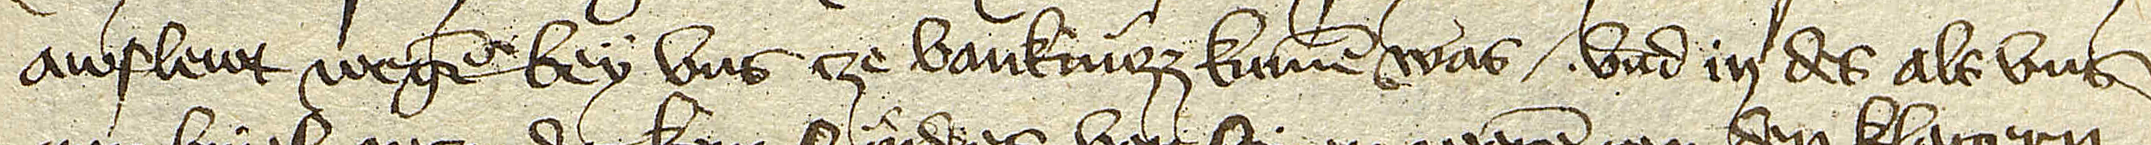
awſlewt wege* bey vns cʒe vanknüʒʒ kume* was / . vnd in des als vns
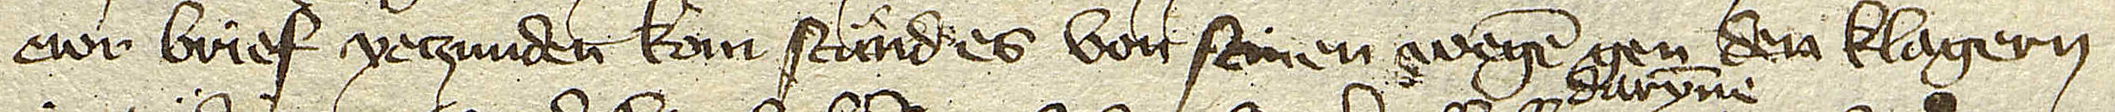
ewr brief yecʒunden köm ſtünd es von ſeinen wege* gen den klagern
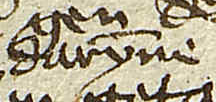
daryne*
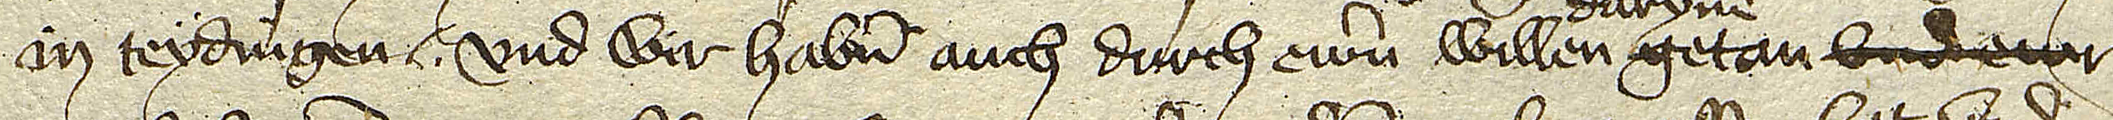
in teydingen / . vnd wir habn* auch durch ewn* willen getan vnd ewr
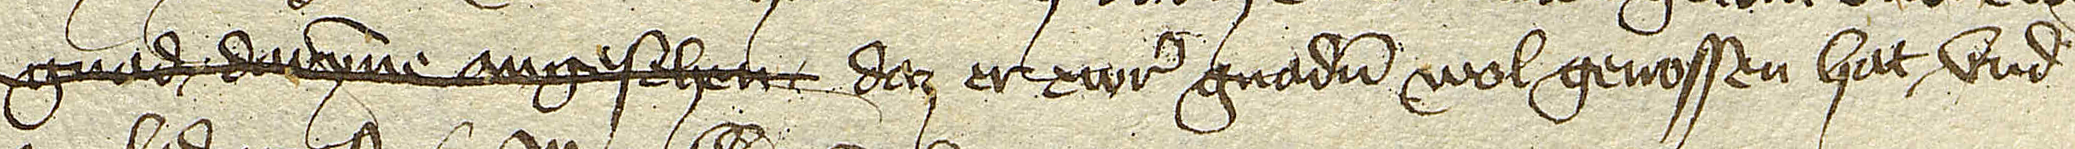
gnad / daryne* angeſehen / daʒ er ewr* gnadn* wol genoſſen hat / vnd
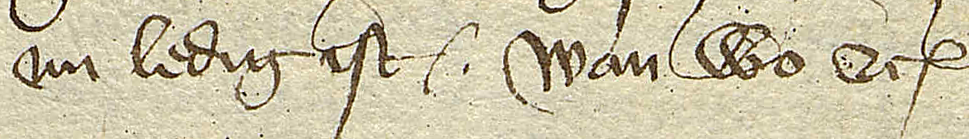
nu ledig iſt / . wan wo ec*
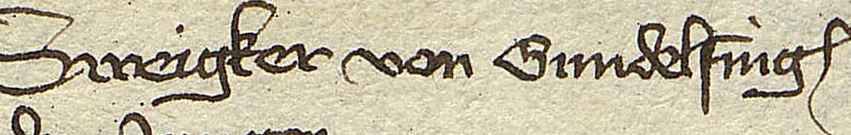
Sweigker von Gundelfing*
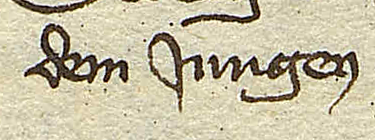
dem Iungen
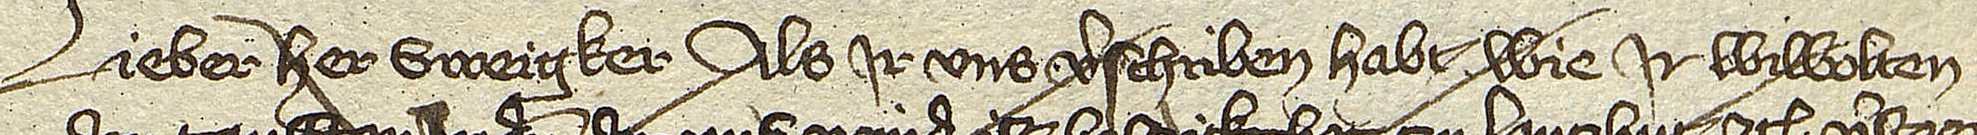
Lieber her Sweigker Als Ir vns v*ſchriben habt /. wie Ir wilbolten
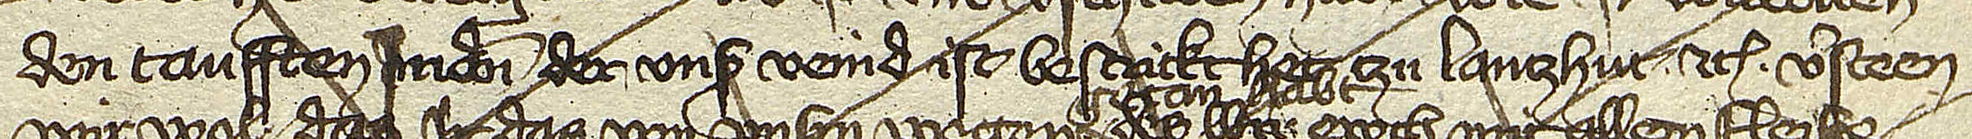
den taufften Iudn* der vnſ* veind iſt beſtrickt het cʒu lancʒhut / . ec*. v*ſteen
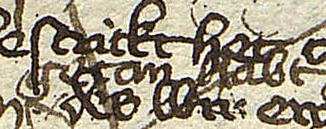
getan habt
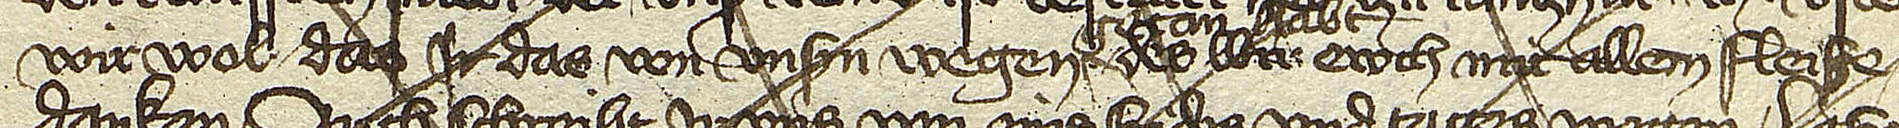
wir wol / das Ir das von vnſ*n wegen . / des wir ewch mit allem fleiſʒe
